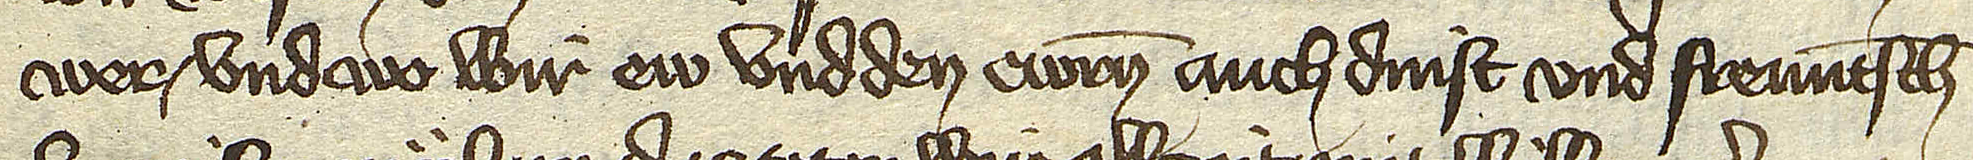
wer / vnd wo wir ew vnd den ewrn* auch dinſt vnd freuntſch*
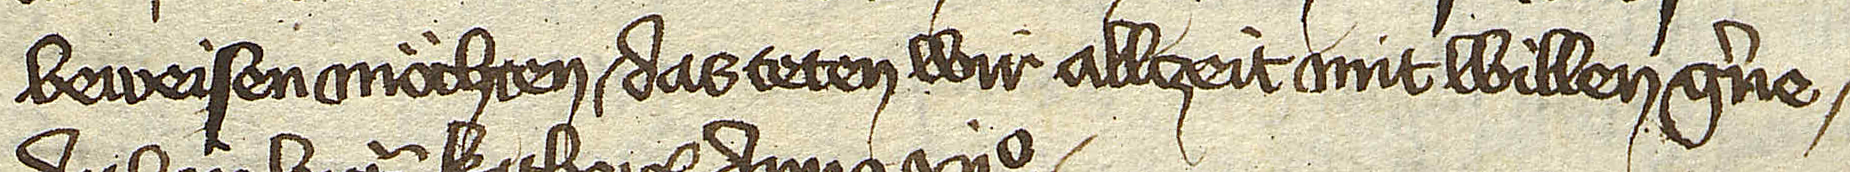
beweiſen möchten / das teten wie allcʒeit mit willen g*ne /
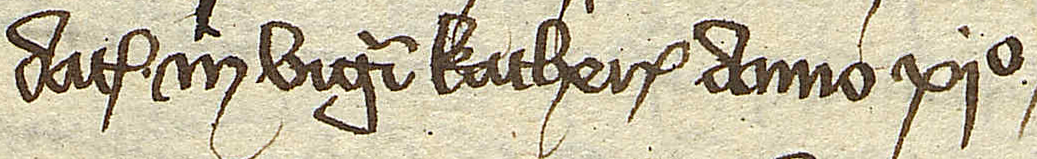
dat* in vigi* kather* Anno xi* /
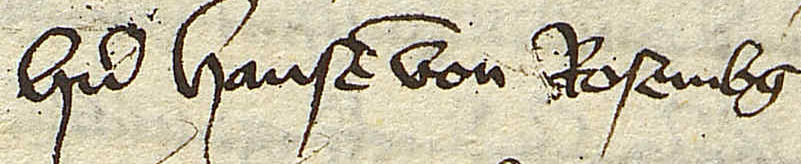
hn* hanſe* von Rotembg*
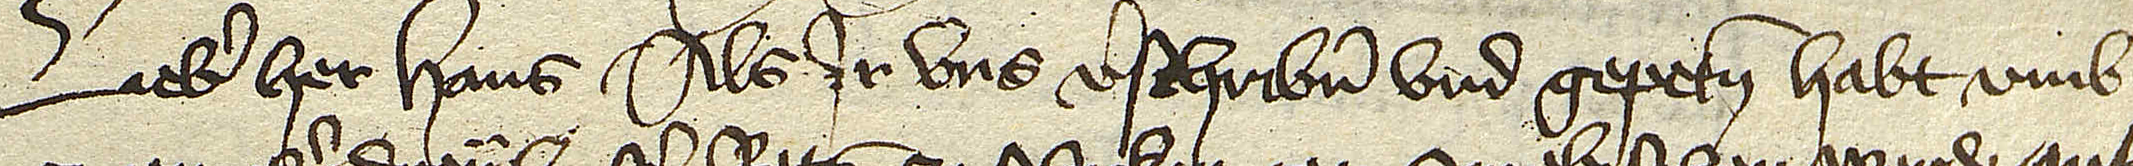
Lieb* her Hans / Als Ir vns v*ſchribn* vnd gepetn* habt vmb
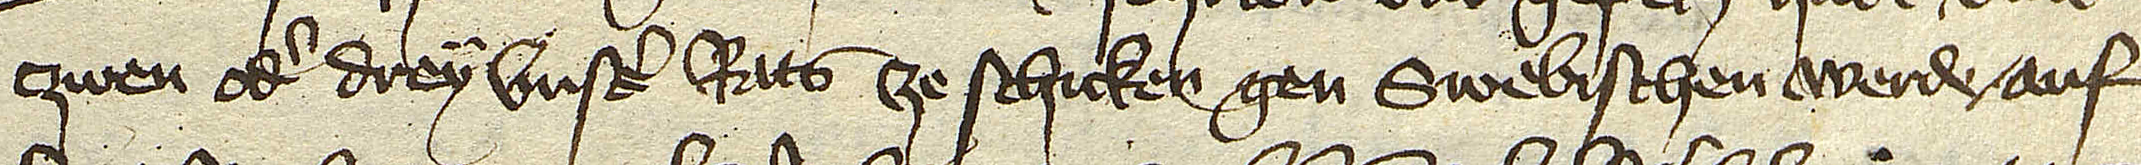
cʒwen od* drey vnſs* Rats cʒe ſchicken gen Swebiſchen werde / auf
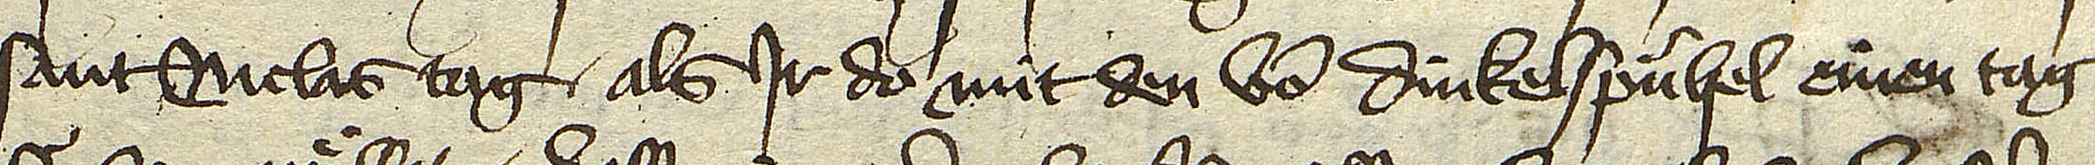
ſant Niclas tag / als Ir do mit den vo* dinkelſpühel einen tag
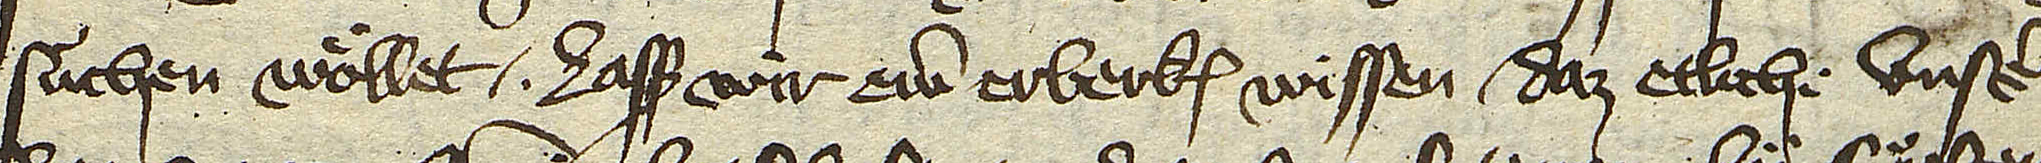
ſüchen wöllet / . Laſſ* wir ew* erberk* wiſſen / daʒ etliche vnſs*
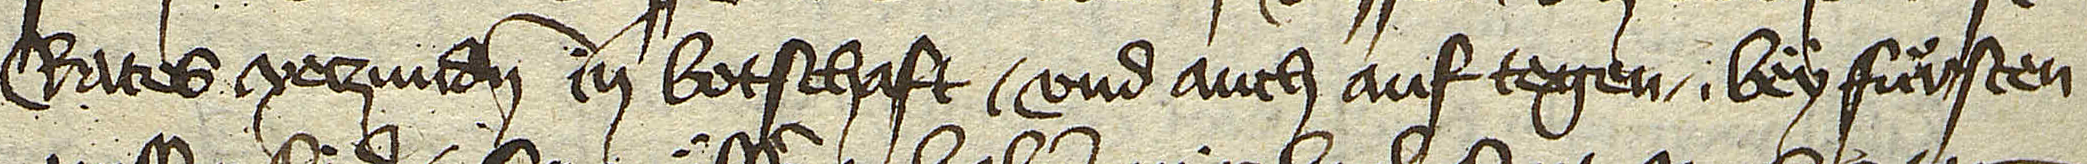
Rates yecʒundn* in botſchaft / vnd auch auf tegen / . bey fürſten
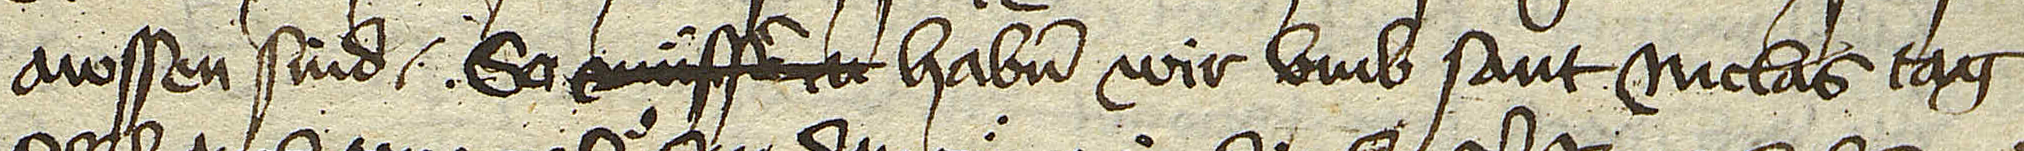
awſſen ſind / . So müſſe* w habn* wir vmb ſant Niclas tag
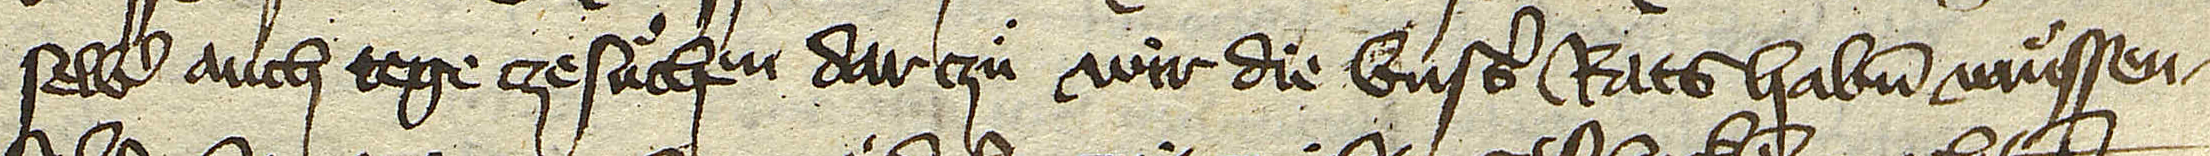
ſelb* auch tege cʒeſüchen darcʒü wir die vnſs* Rats habn* müſſen /
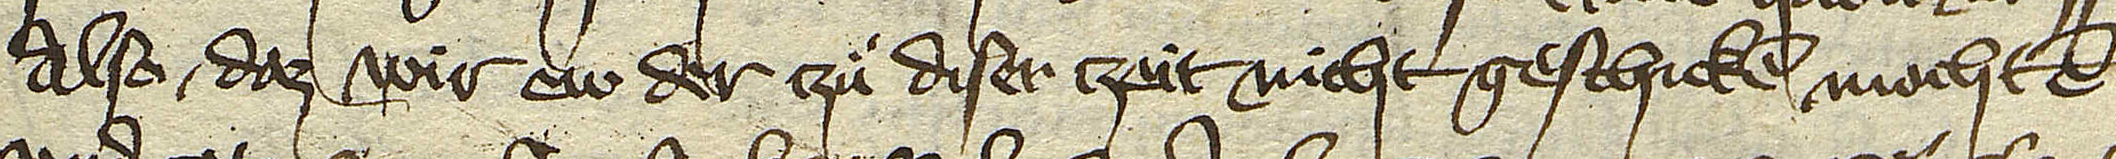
Alſo / daʒ wir ew der cʒü diſer cʒeit nicht geſchicke* mochte*
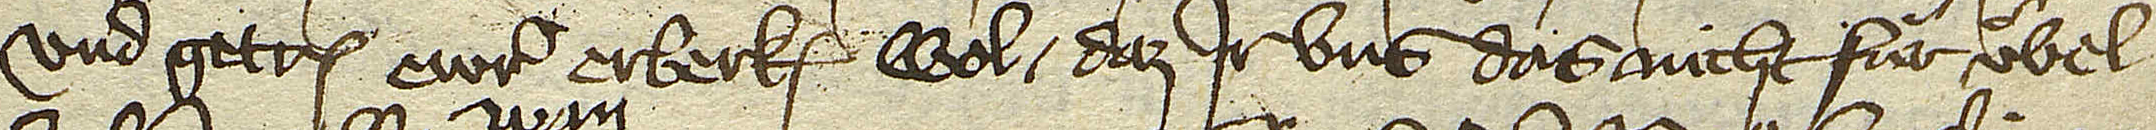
vnd getr* ewr* erberk* wol / daʒ Ir vns das nicht für v̈bel
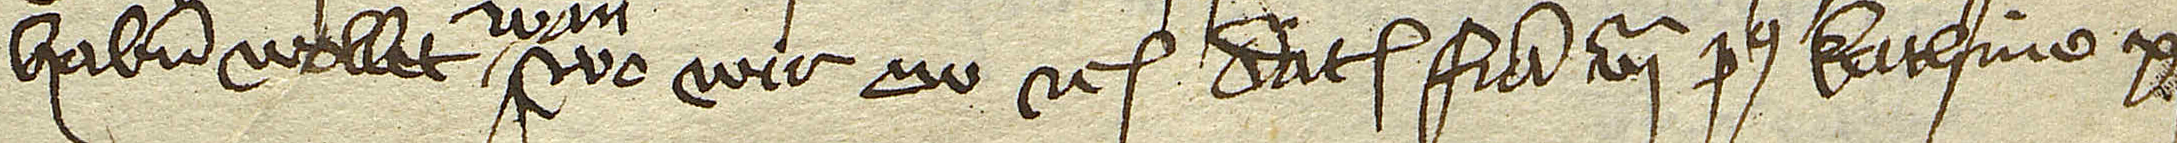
habn* wollet / wo wir ew ec* Dat* fia* vi* p* kath*ine xi*
